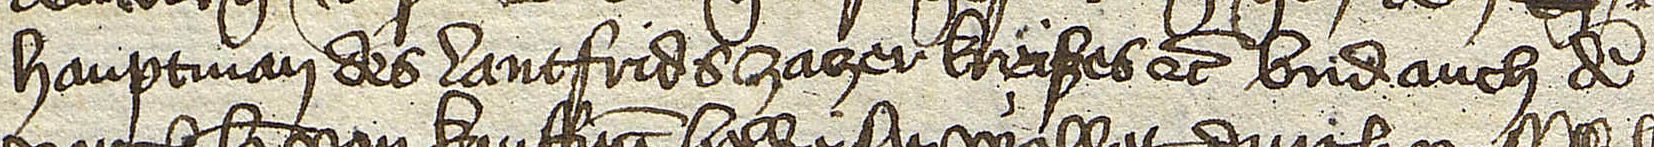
hauptman des lantfrids cʒacʒer kreiſʒes ec* vnd auch d*
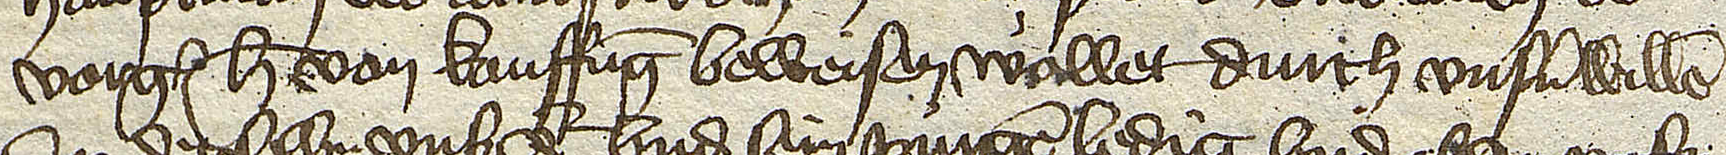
vorg* h* von kauffu*g beweiſen wöllet durch vnſn* wille*
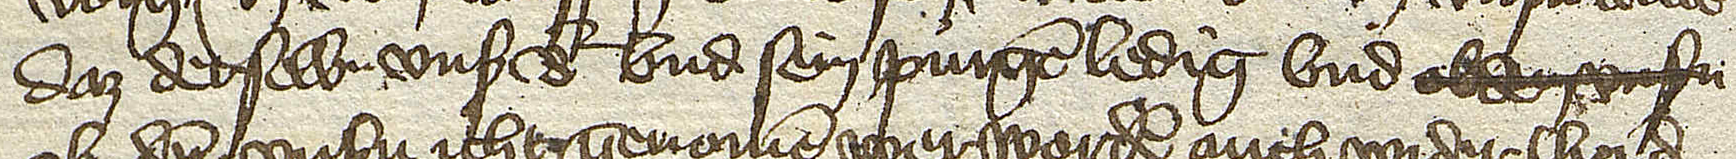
daʒ derſelb ~ vnſ* B* vnd ſein pürge* ledig vnd ob dem vnſ*n
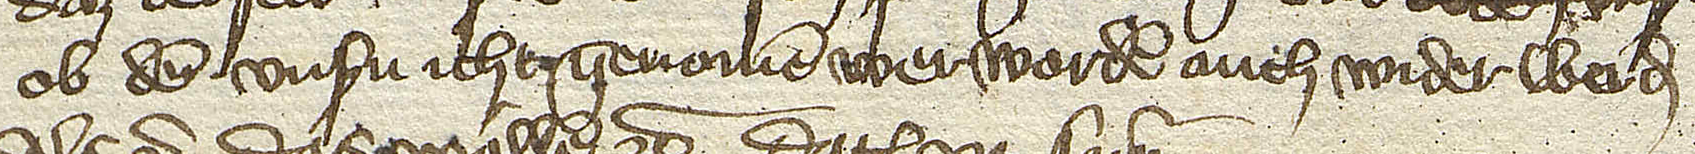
ob de* vnſ*n icht genome* wer worde* auch wider werd*
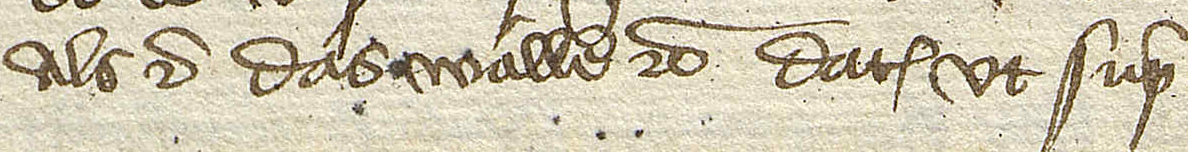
Als ec* Das wölle* ec* Dat* vt ſup*
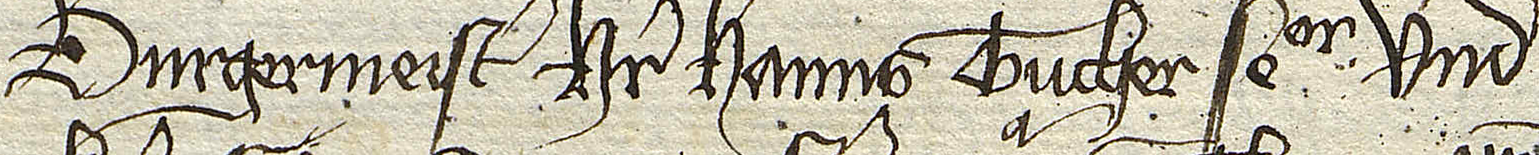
Burgermeiſt* Hr* Hanns Tucher ſe* Vnd
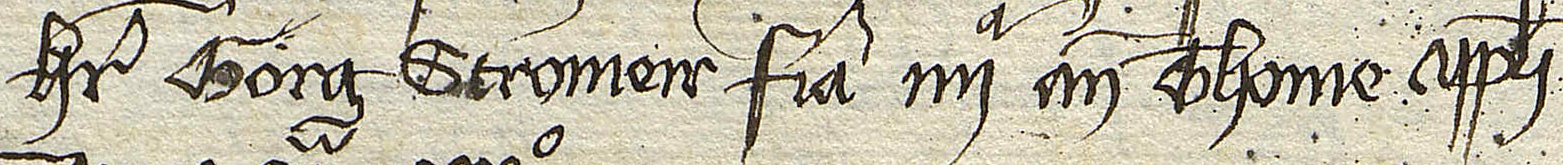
Hr* Görg Stromeir fia* iiii* an* Thome appli*
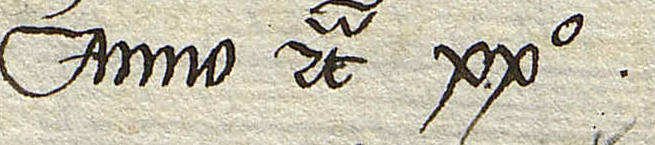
Anno ec* xx*
